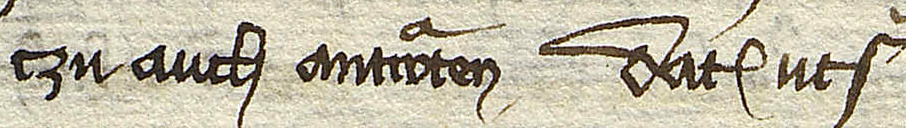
cʒu auch antw*ten Dat* ut ſ*
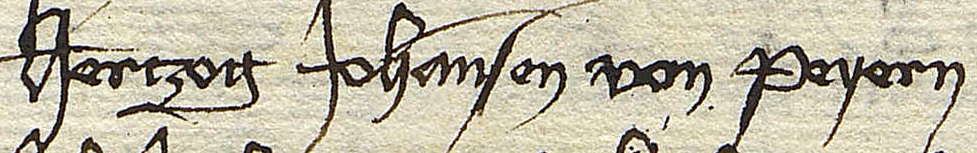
Hercʒog Iohanſen von Peyern
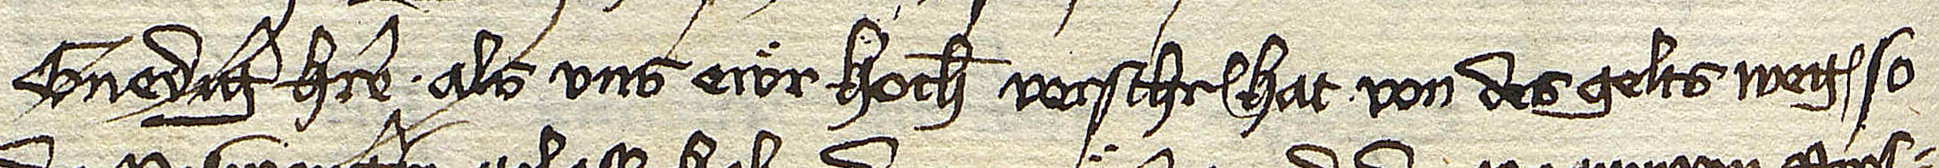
Gnedig* h*re . als vns ewr hoch* verſchr* hat . von des gelts weg* ſo
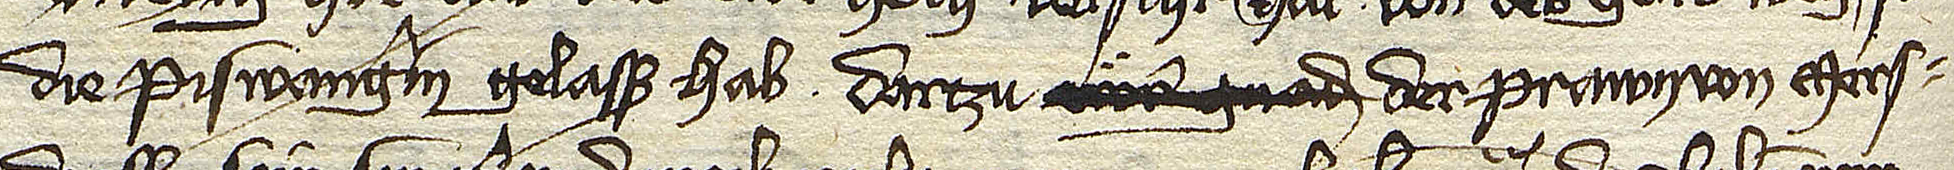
die Piſwang*in gelaſſ* hab . darcʒu ew*n gnad* der Prawn von Merſ =
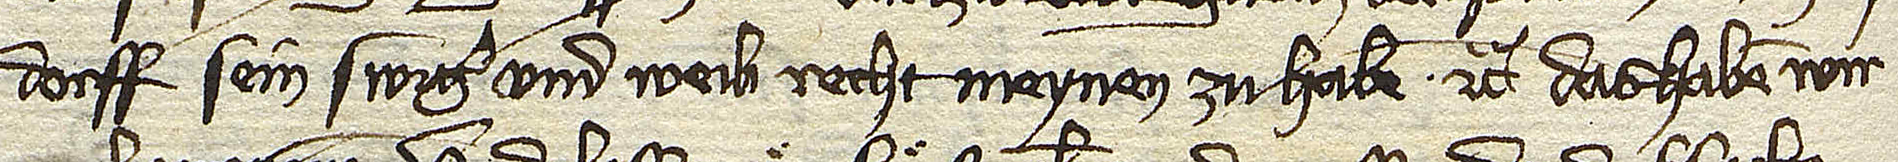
dorff ſein ſwig* vnd weib recht meynen ʒu habe* . ec* das habe* wir
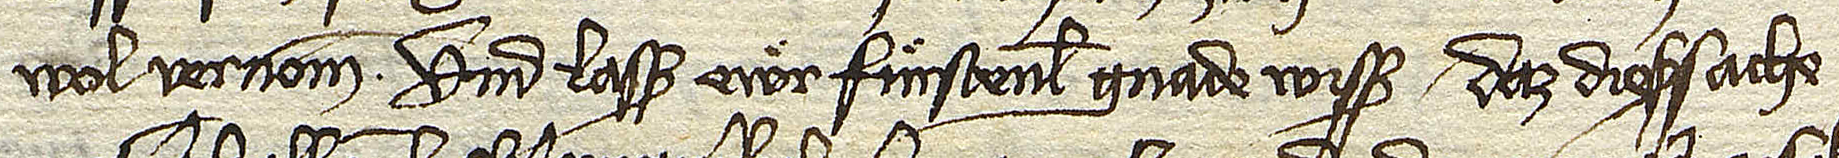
wol vernom* . Vnd laſſ* ewr fürſtenl* gnade wiſſ* / daʒ dieſ* ſache
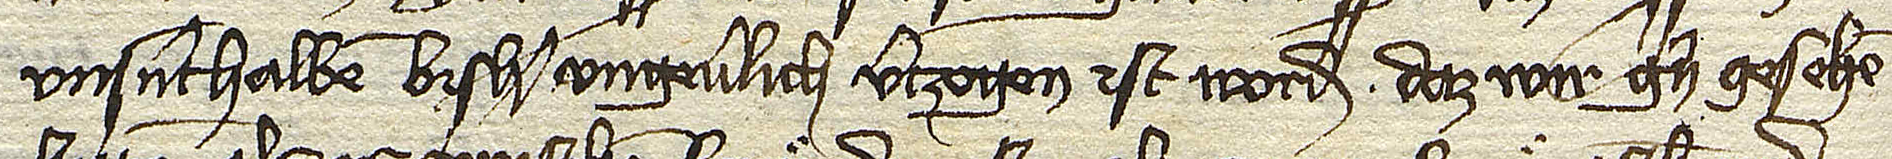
vnſ*nthalbe* biſh* vngeu*lich v*cʒogen iſt word* . daʒ wir g*n geſehe*
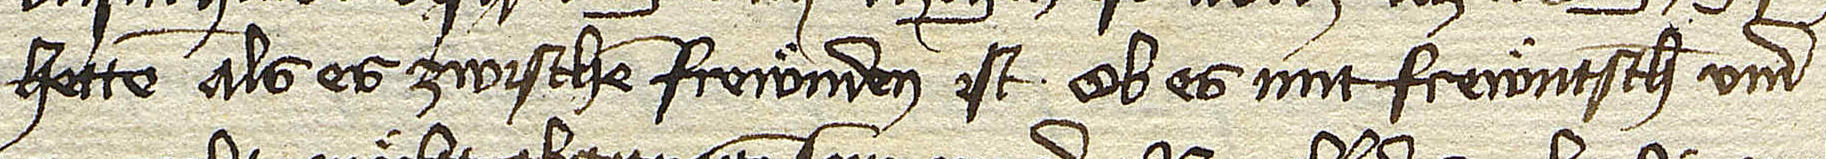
hette* als es ʒwiſche* frewnden iſt . Ob es mit frewntſch* vnd
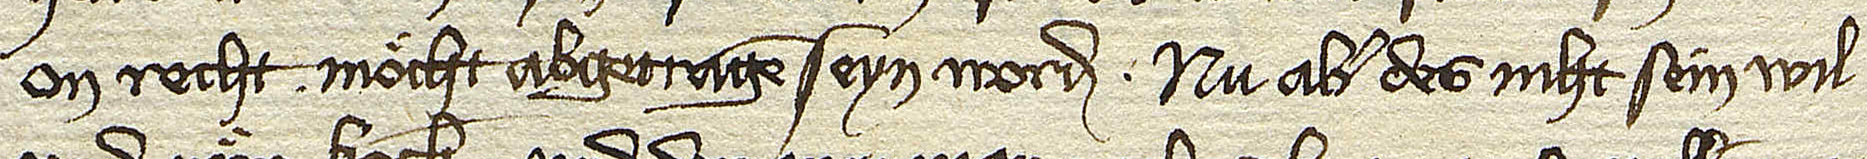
on recht . möcht abgetrage* ſeyn word* . Nu ab* des niht ſein wil
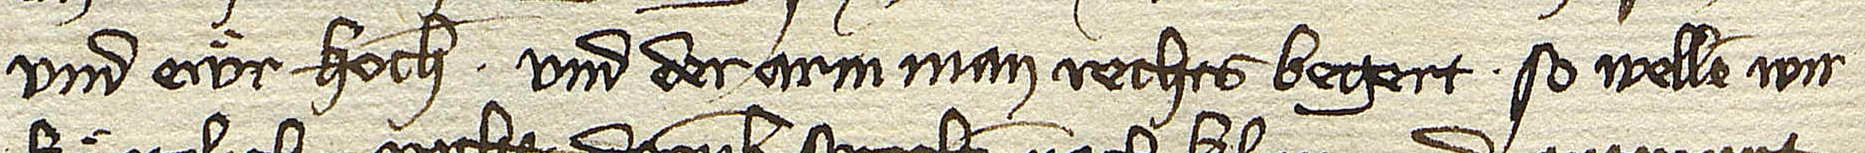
vnd ewr hoch* . vnd der arm man rechts begert . ſo welle* wir
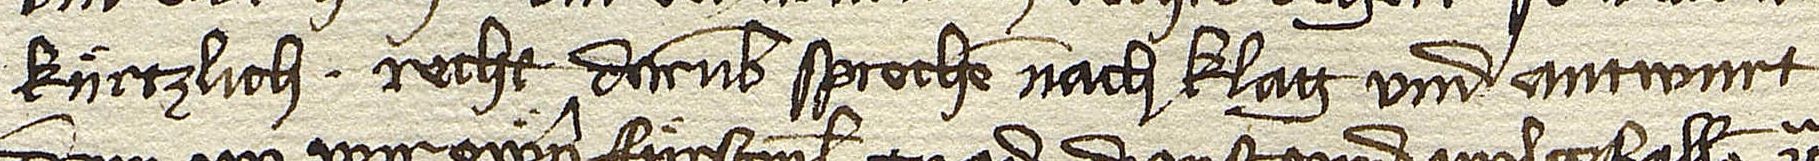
kürcʒlich . recht daru*b ſpreche* nach klag vnd antwurt
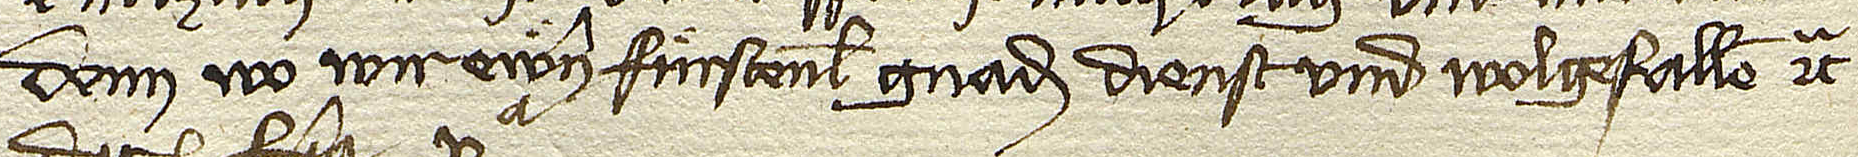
Denn wo wir ew*n fürſtenl* gnad* dienſt vnd wolgefalle* ec*
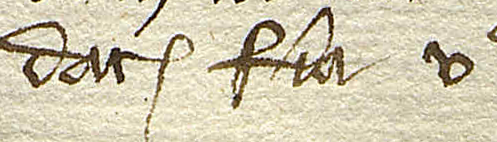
Dat* fia* v*
